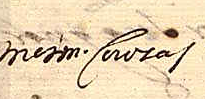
mesm. Couzas
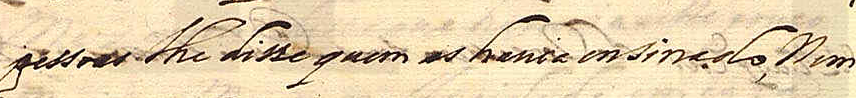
pessoas lhe disse quem as hauia ensinado, Nem
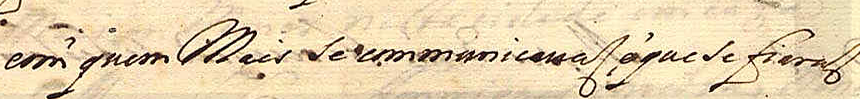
com quem Mais se communicauaꝭ, e que se fiaraꝭ
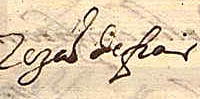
Rezaõ de fiar
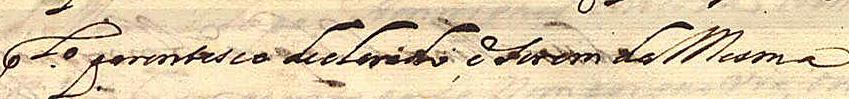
p̄Lo parentesco declarado, e serem da Mesma
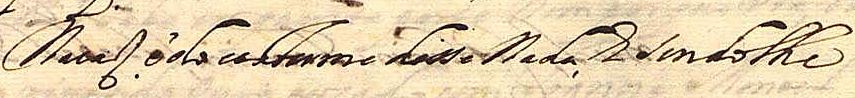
Nacaꝭ e do costume disse Nada, E sendolhe
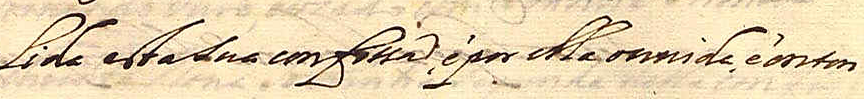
Lida esta sua confissā, e por ella ouuida, e enten
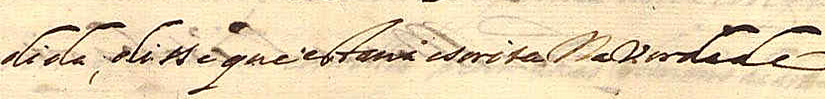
dida, disse que estaua escrita Na verdade
